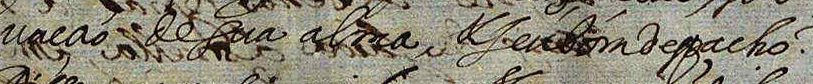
uaçaõ de sua alma, & seu bom despacho?
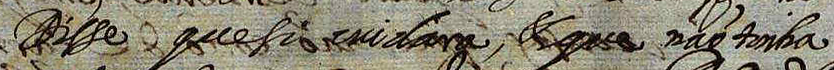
Disse que si cuidara, & que naõ tinha
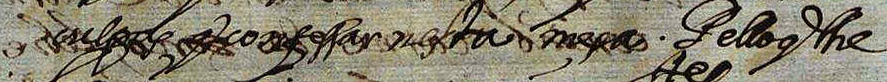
culpas q̄ confessar nesta mesa. Pello q̄ lhe
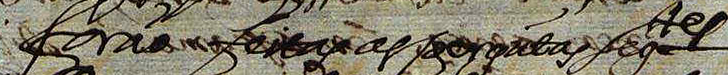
foraõ feitas as pergūtas segtes
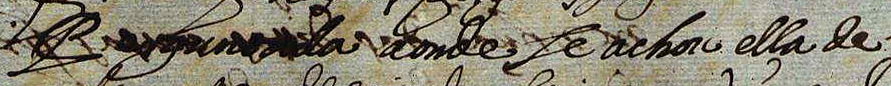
Perguntada aonde se achou ella de
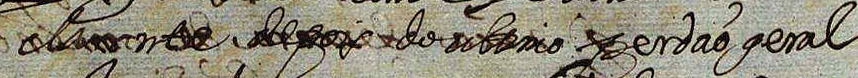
clarante depois do ultimo perdaõ geral
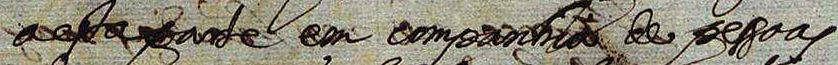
a esta parte em companhia de pessoas
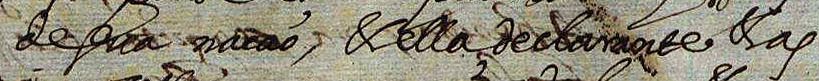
de sua naçaõ, & ella declarante & as
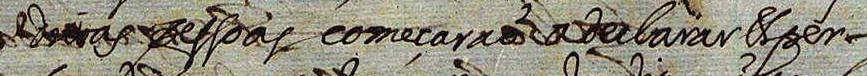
dittas pessoas começaraõ a declarar & per
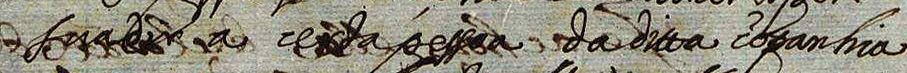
suadir a certa pessoa da ditta cōpanhia
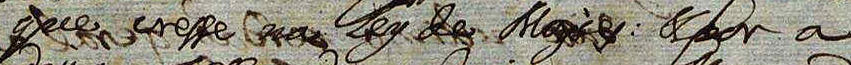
que cresse na Ley de Moyses: & por a
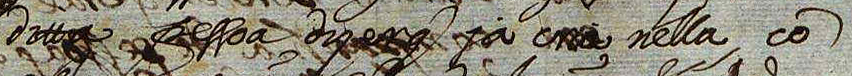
ditta pessoa dizer q̄ ja cria nella cō
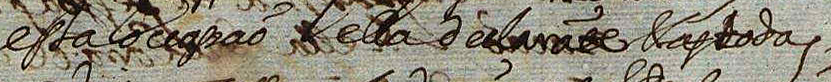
esta occasiaõ ella declarāte & a todas
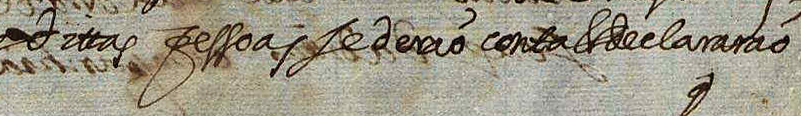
dittas pessoas se deraõ conta & declararaõ
